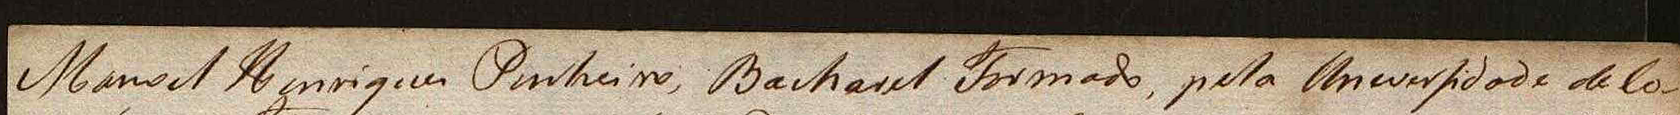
Manoel Henriques Pinheiro, Bacharel Formado, pela Universidade de Co
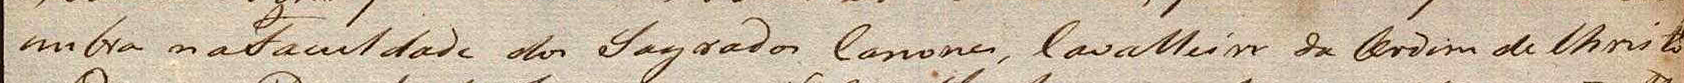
imbra na Faculdade dos Sagrados Canones, Cavalleiro da Ordem de Christo
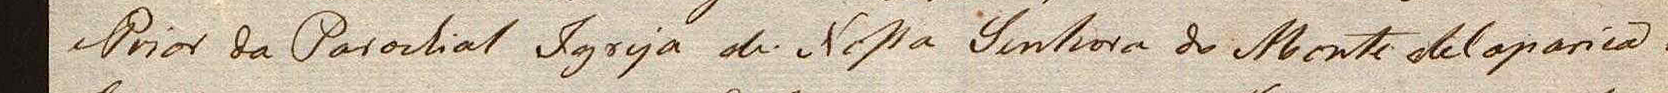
e Prior da Parochial Igreja de Nossa Senhora do Monte de Caparica
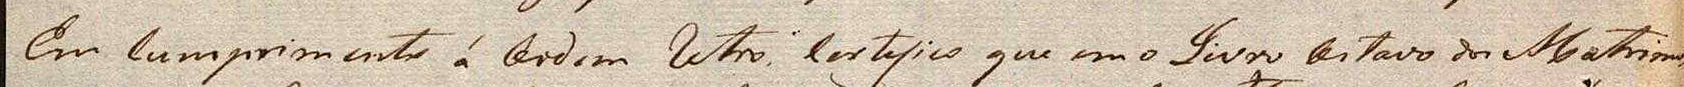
Em Cumprimento á Ordem Retro, Certefico que em o Livro Oitavo dos Matrimo
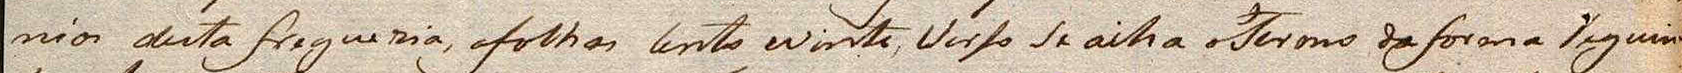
nios desta freguezia, a folhas Cento e vinte, Verso se acha o Termo da forma seguin
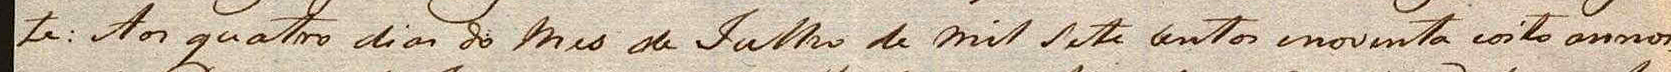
te: Aos quatro dias do mes de Iulho de mil setecentos e noventa e oito annos
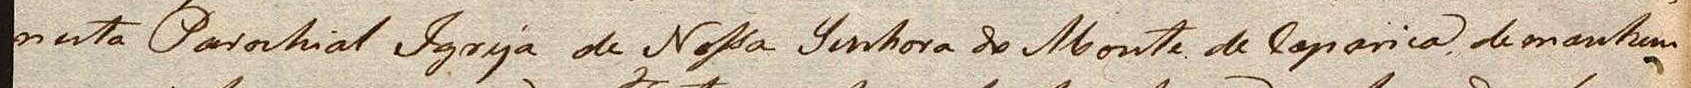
nesta Parochial Igreja de Nossa Senhora do Monte de Caparica, de manhem
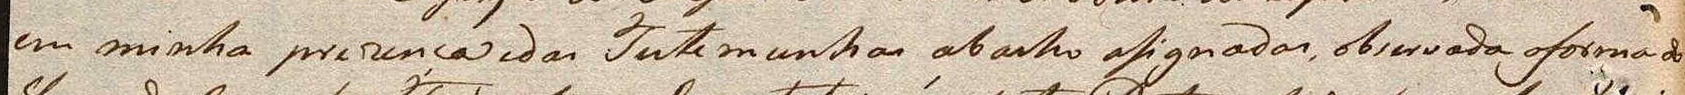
em minha prezença e das Testemunhas abacho asignadas, observada a forma do
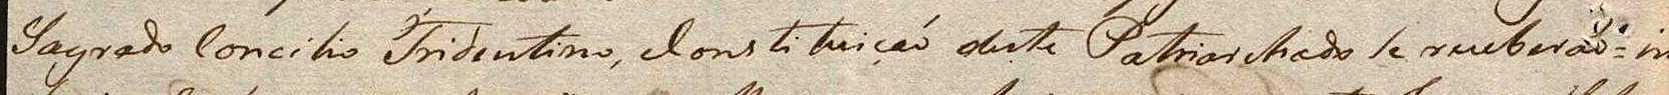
Sagrado Concilio Tridentino, e Constituiçaõ deste Patriarchado se receberaõ = in
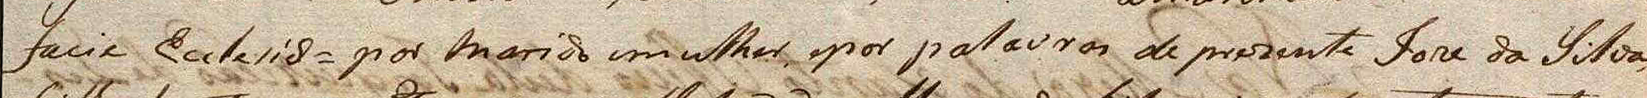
faciæ Ecclesiæ= por marido e mulher, e por palavras de prezente Ioze da Silva,
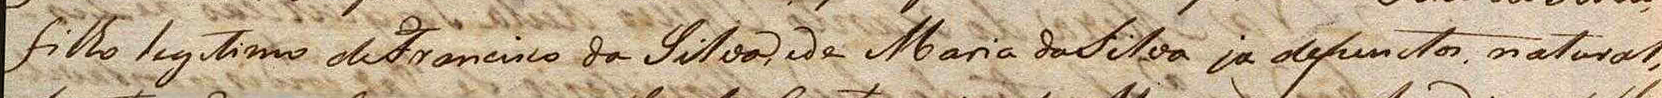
filho legitimo de Francisco da Silva, e de Maria da Silva ja defunctos natural,
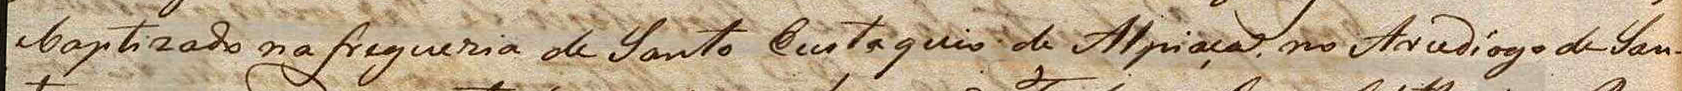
e baptizado na freguezia de Santo Eustaquio de Alpiaça, no Arcediago de San
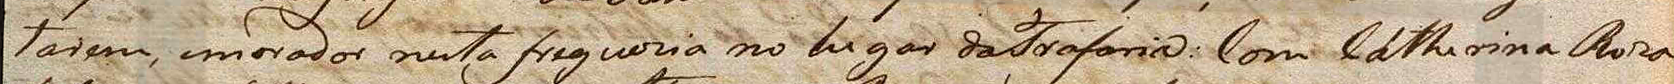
tarem, e morador nesta freguezia no lugar da Trafaria: Com Catherina Roza
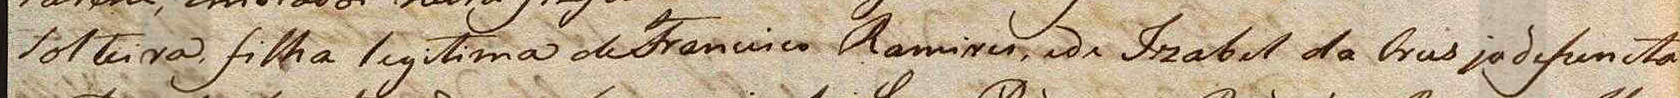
solteira, filha legitima de Francisco Ramires, e de Izabel da Crus ja defuncta
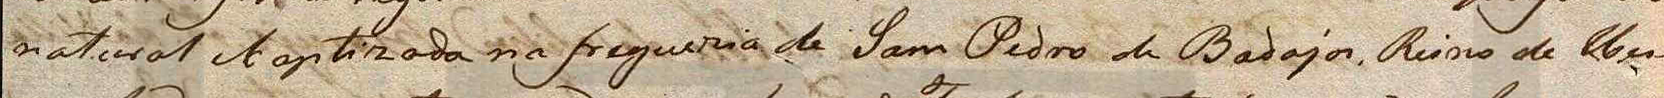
natural e baptizada na freguezia de Sam Pedro de Badajos, Reino de Hes
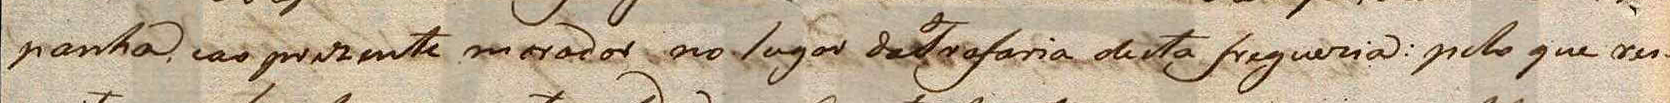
panha, e ao prezente morador no lugar da Trafaria desta freguezia: pelo que res
